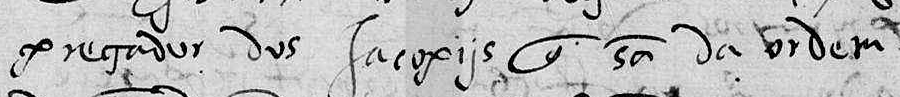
pregador dos Jacopijs q̅ s̅a da ordem
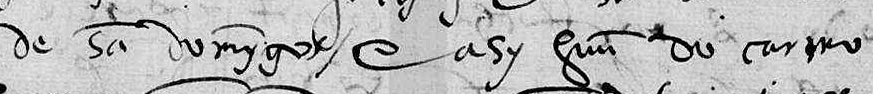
de sā dom̄ygos / e asy huū do carmo
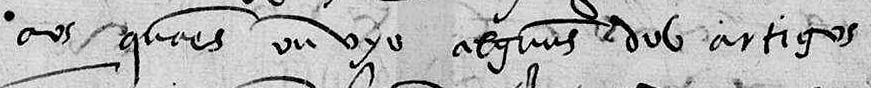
aos quāes ouvyo alguūs dos artigos
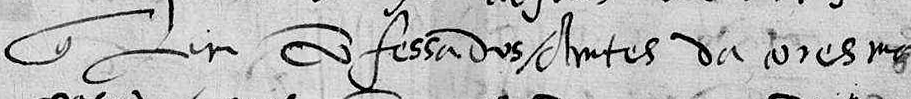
q̅ tem co̅fessados / Amtes da coresma
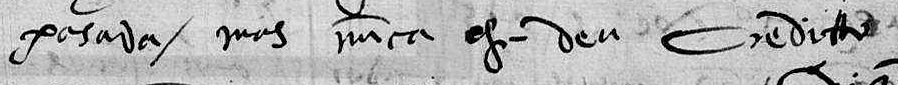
pasada / mas nūca lhe deu Creditto
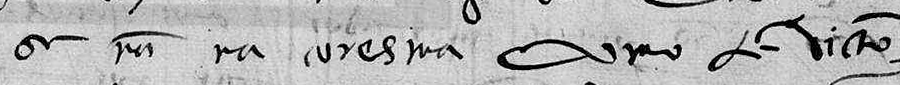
se nā na coresma Como tē dicto
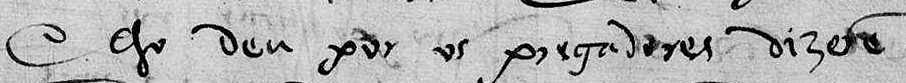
e lho deu por os pregadores dizerē
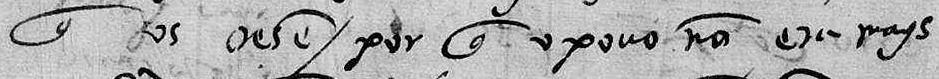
q̄tos cresē / por q̄ o pouo nā era majs
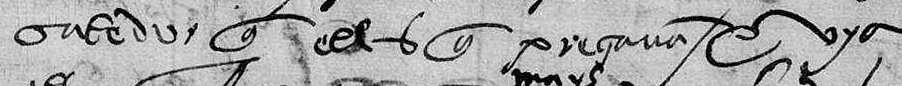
sabedor q̄ elles q̄ pregauā / e vya
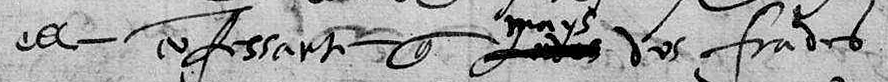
elle cōfessante q̄ mays dos frades
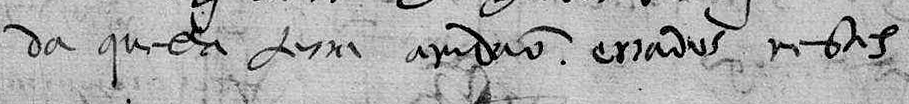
daquella terra amdaõ errados nestes
